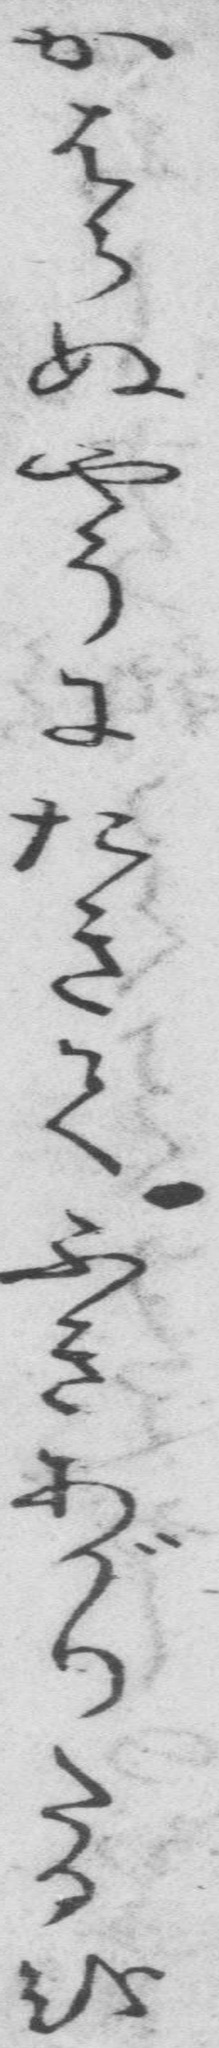かはらぬやうにたきて。ふきあがりたるを
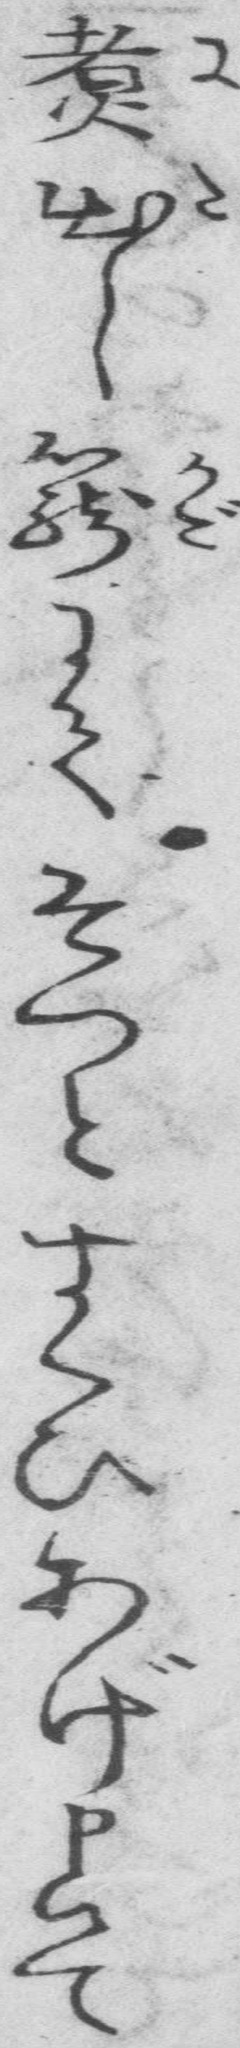煮出し籠にて。そつとすくひあげ申候て
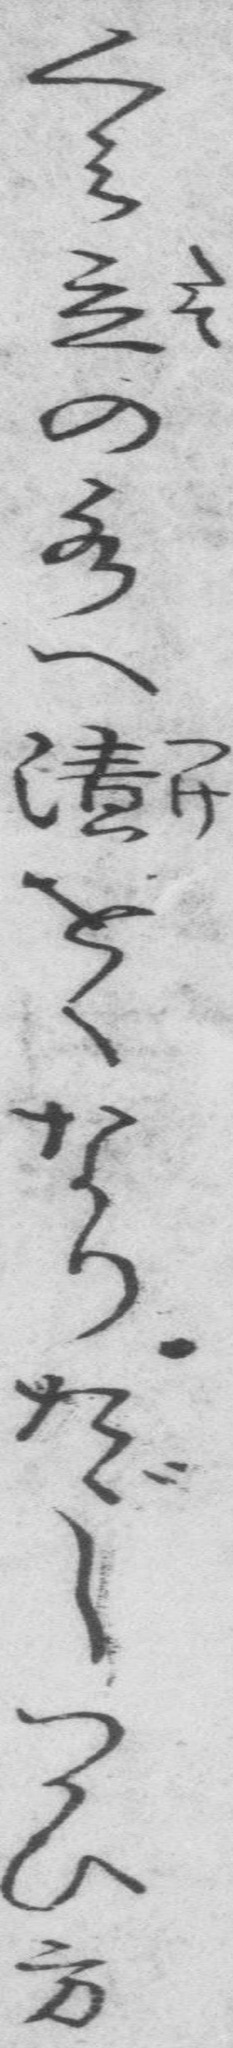くみ立の水へ漬をくなり。たゞしつかひ方
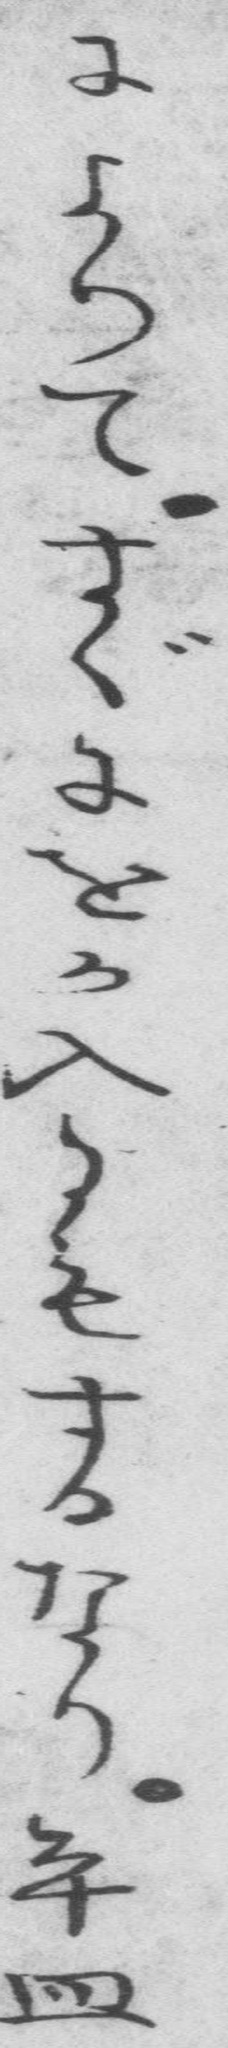によりて。すぐにをか入るもするなり。平皿
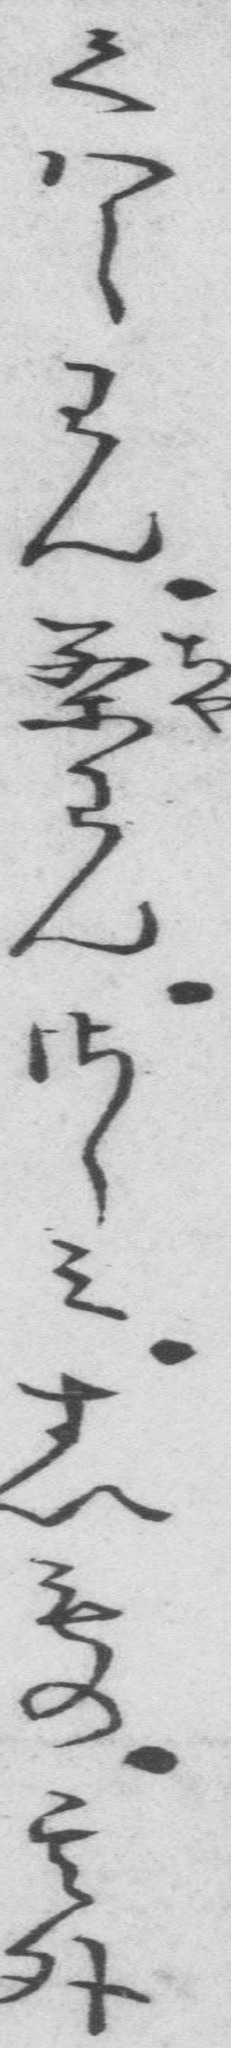くはしわん。茶わん。さしみ。すいもの。其外
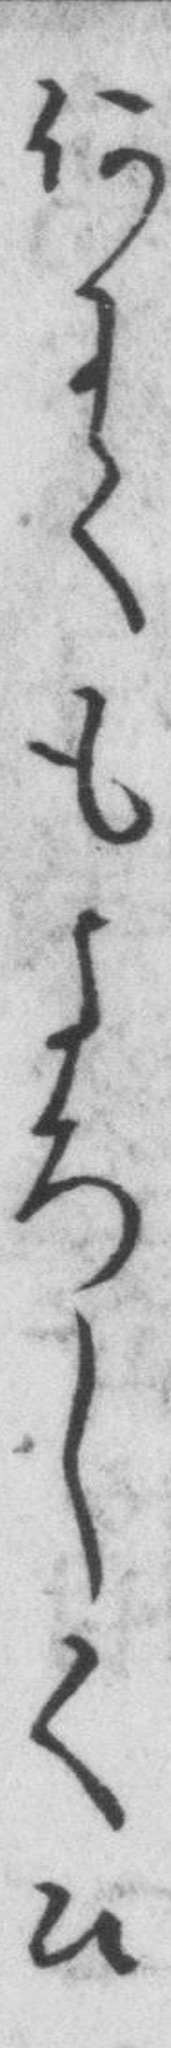何にてもよろしく候
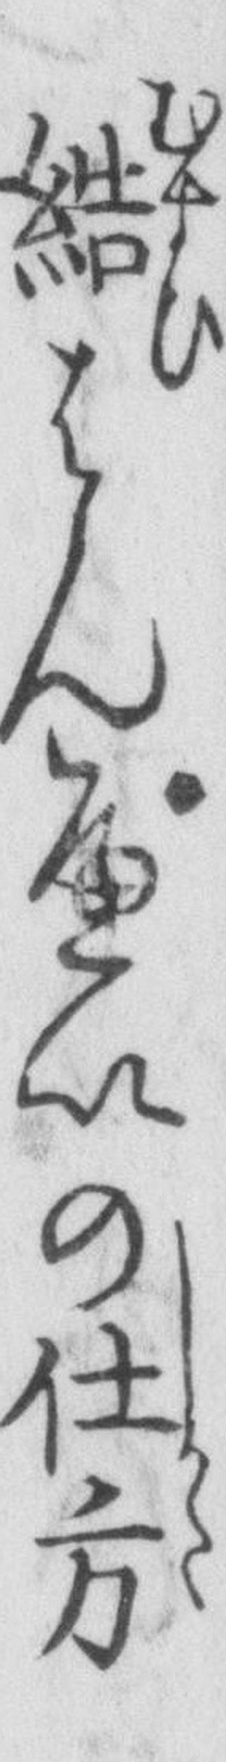結はんぺいの仕方
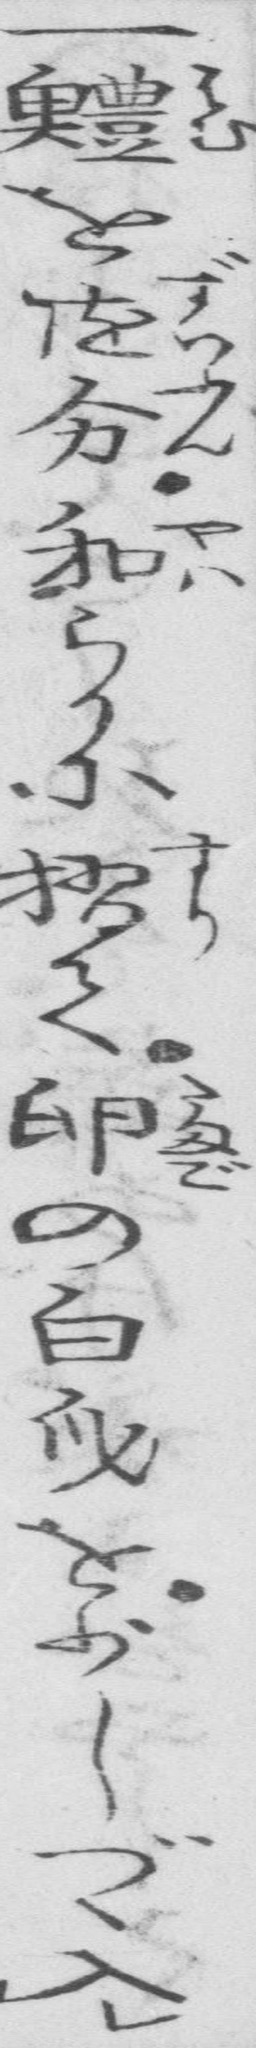一鱧を随分。和らかに摺て。卵の白身を。少しづゝ入れ
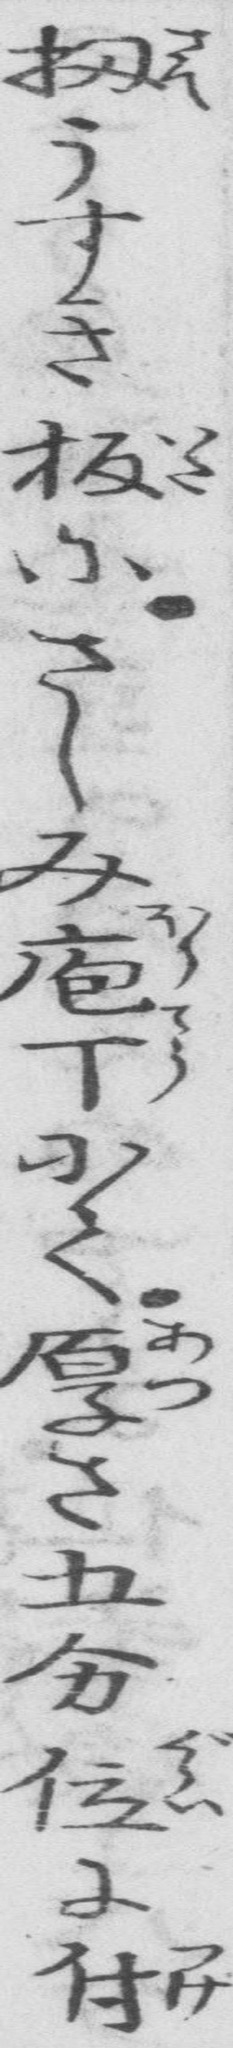扨うすき板に。さしみ包丁にて。厚さ五分位に付
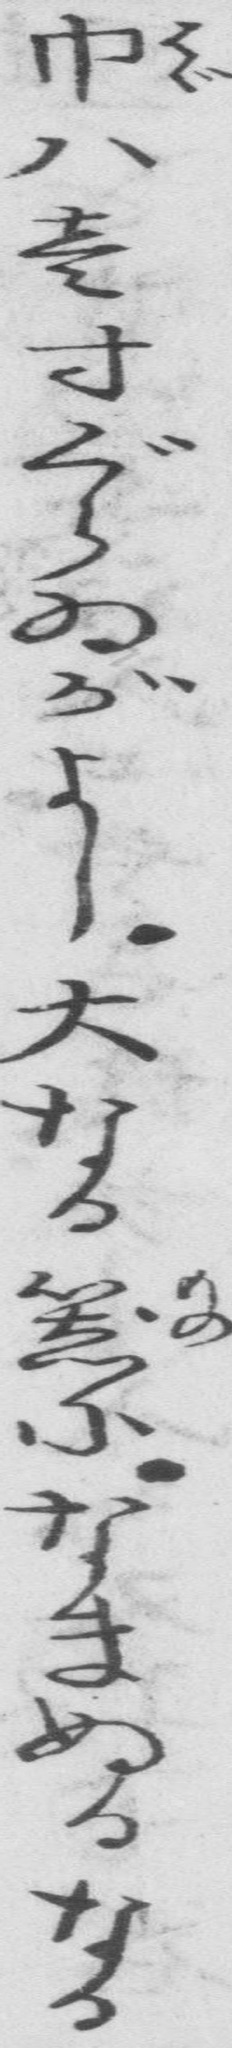巾は壱寸ぐらゐがよし。大なる器に。なまぬるなる
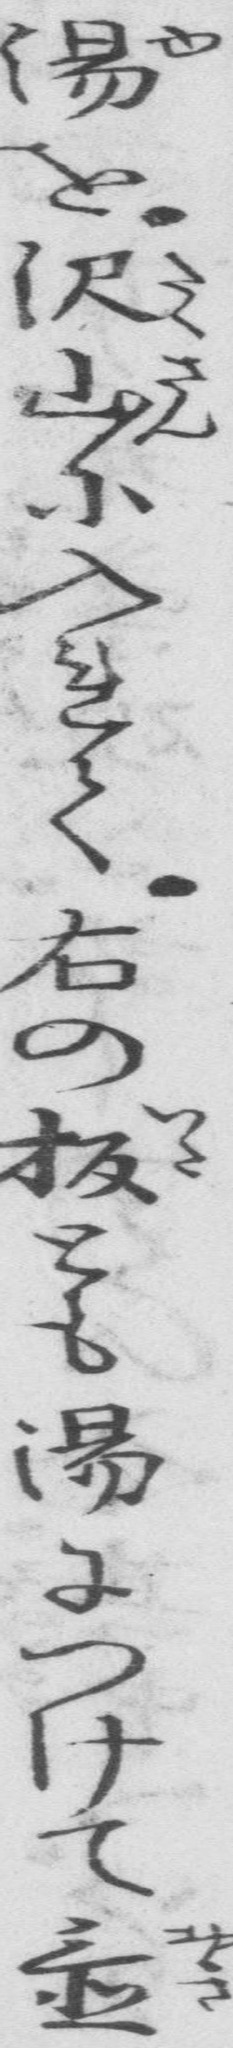湯を。沢山に入れて。右の板とも湯につけて置
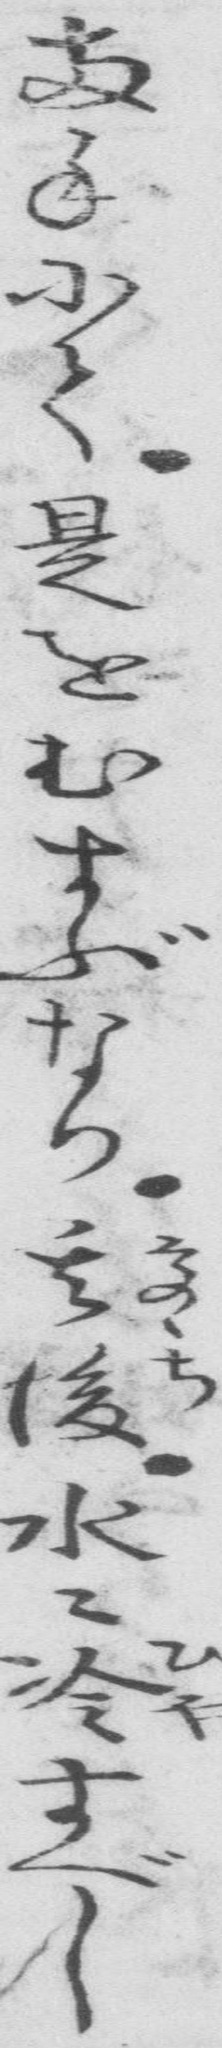両手にて。是をむすぶなり。其後。水に冷すべし
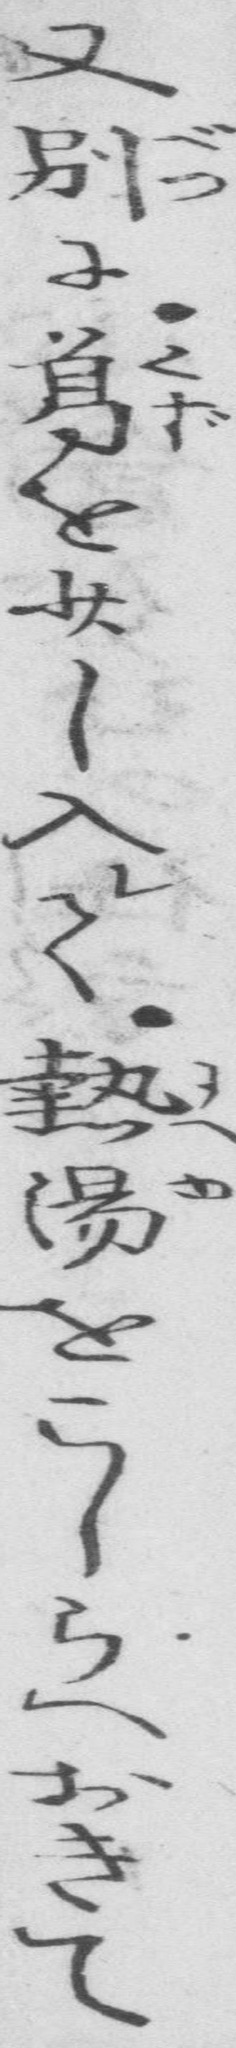又別に。葛を少し入れて。熱湯をこしらへおきて
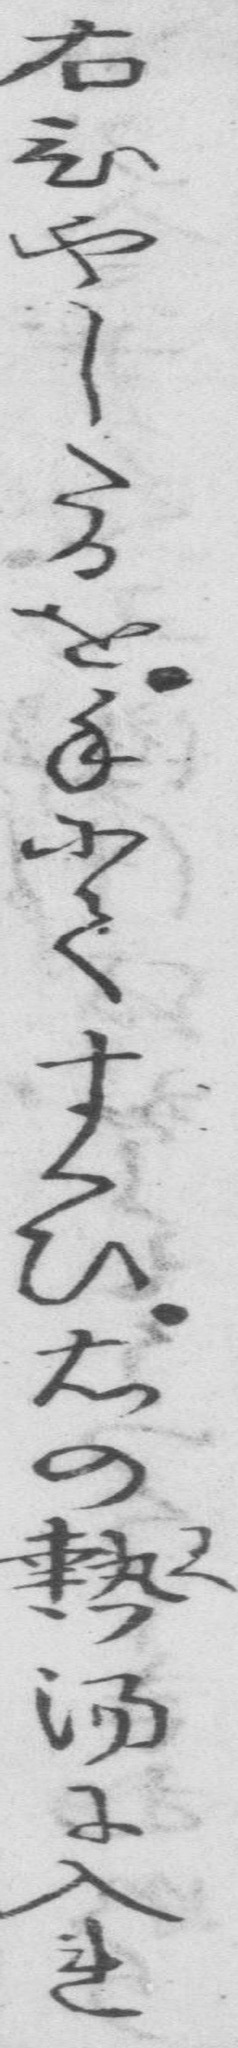右ひやしたるを。手にてすくひ。右の熱湯に入れ
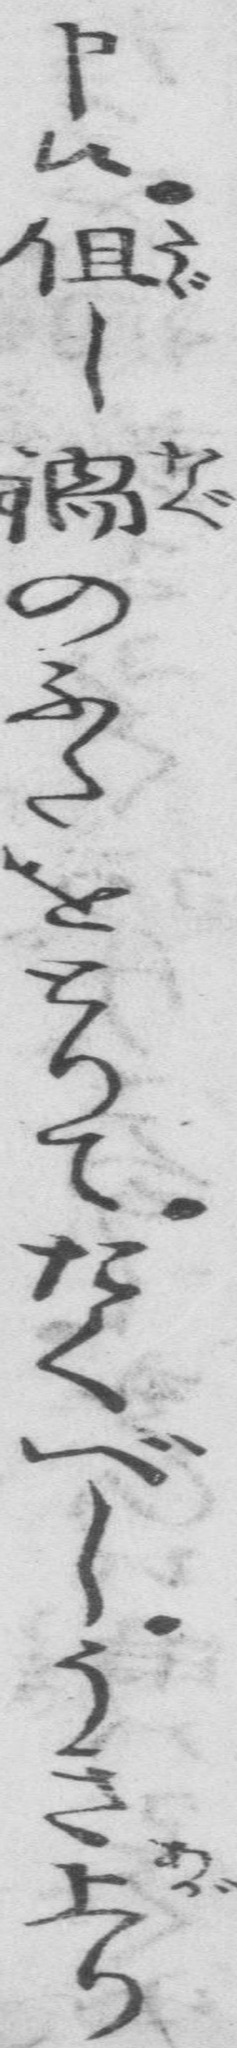申候。但し鍋のふたをとりて。たくべし。うき上り

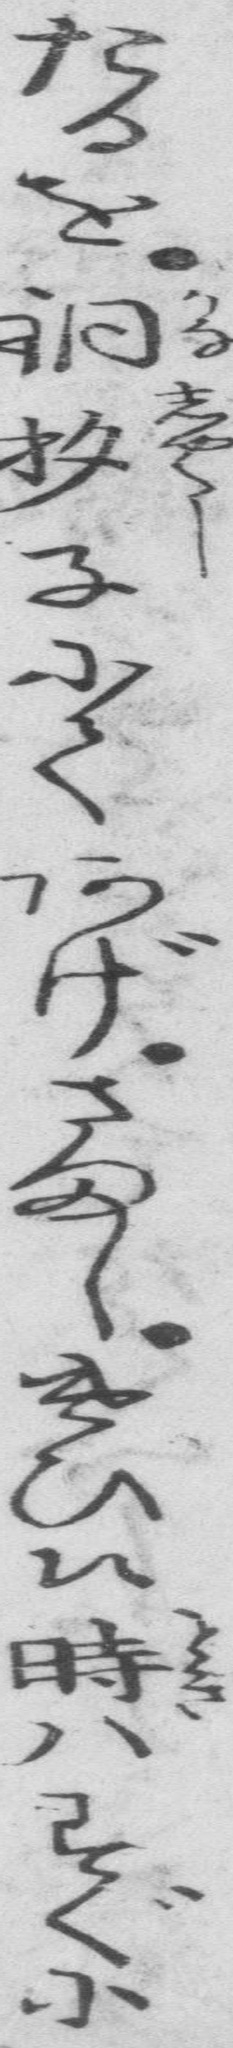たるを。銅杓子にてあげ。さまし。遣ひ候時はすぐに
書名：萬寳料理秘密箱
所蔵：大阪府立大学学術情報センター 国文学研究資料館
